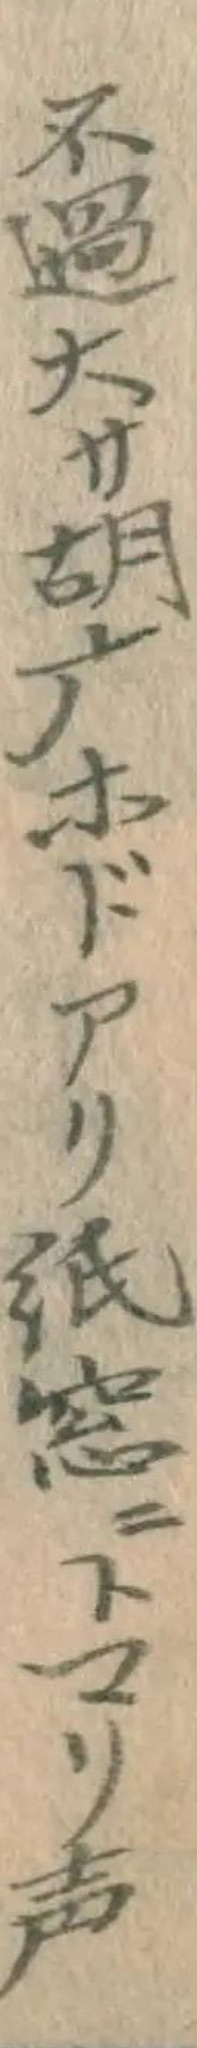不過大サ胡广ホドアリ紙窓ニトマリ声
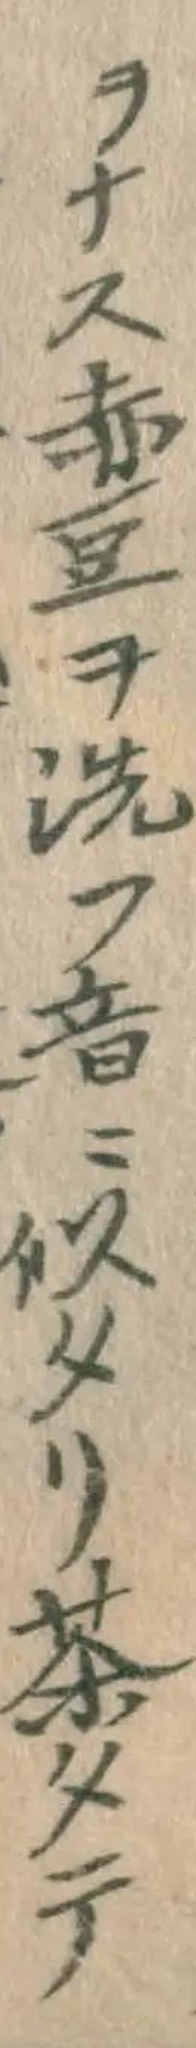ヲナス赤豆ヲ洗フ音ニ似タリ茶タテ
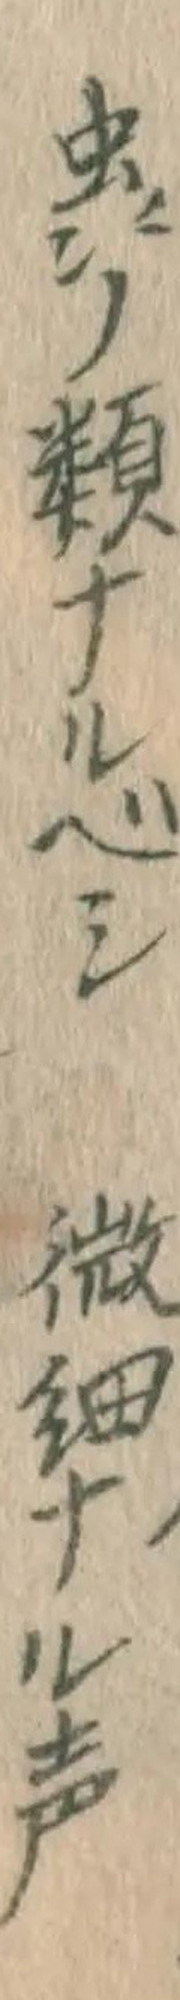蟲ノ類ナルベシ微細ナル声
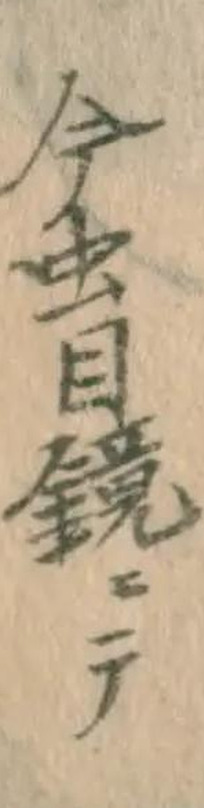今虫目鏡ニテ
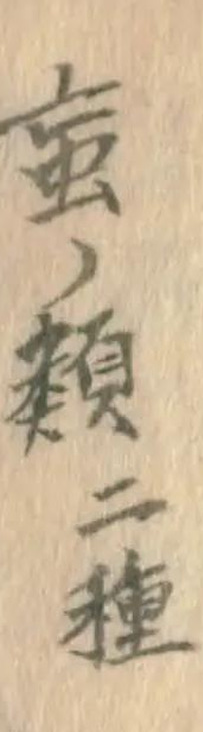䖟ノ類二種
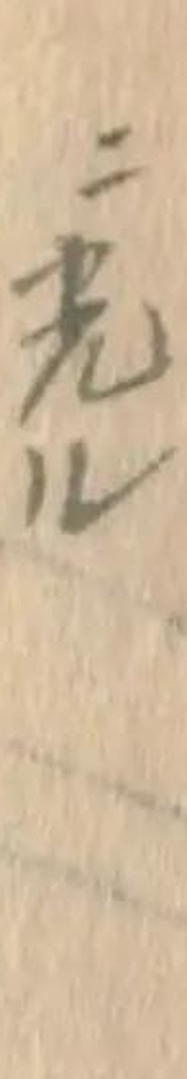ニ光ル
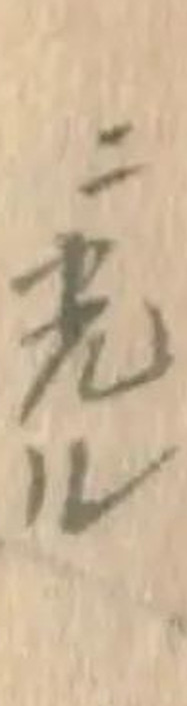ニ光ル
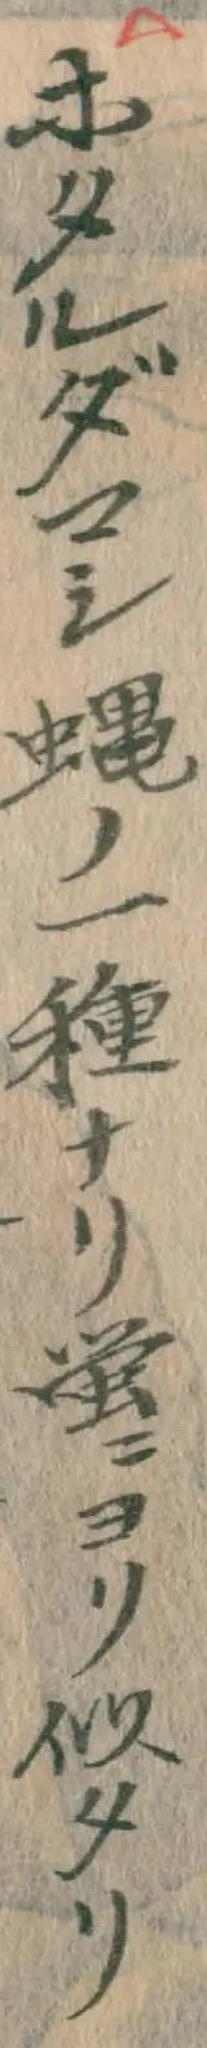△ホタルダマシ蝿ノ一種ナリ蛍ニヨリ似タリ
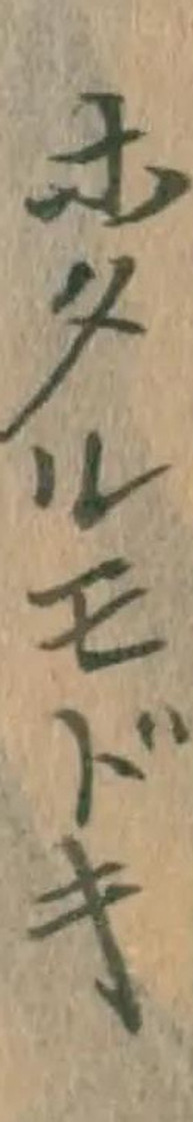ホタルモドキ
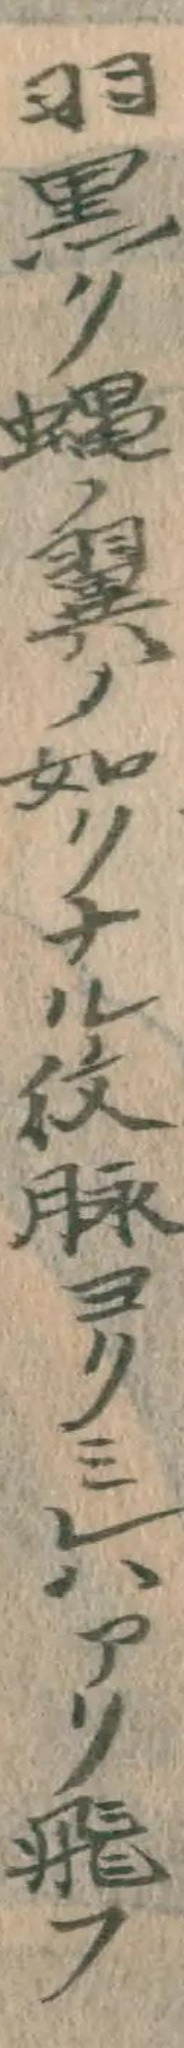羽黒ク蝿ノ翼ノ如クナル紋脉ヨリミレハアリ飛フ
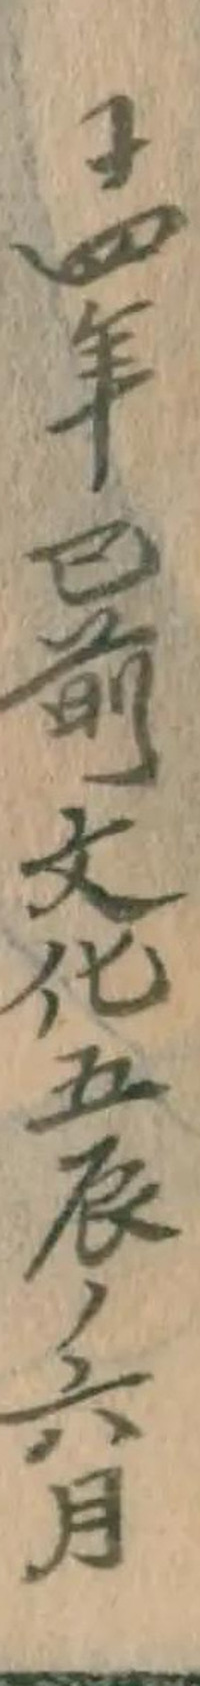十四年已前文化五辰ノ六月
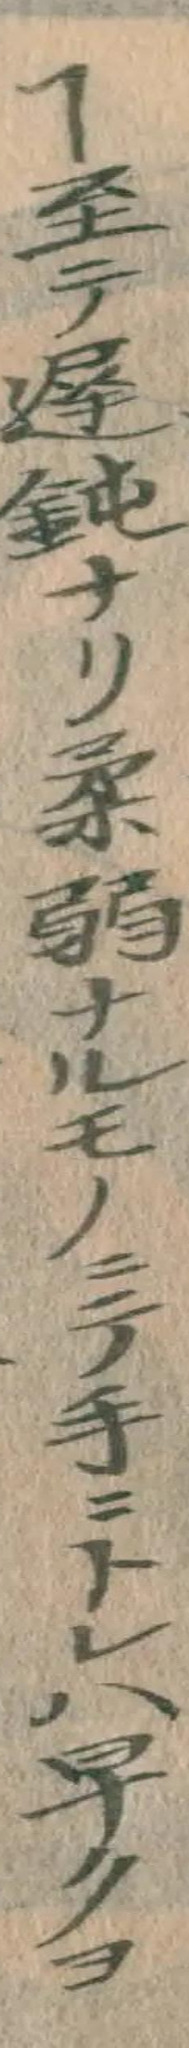コト至テ遅鈍ナリ柔弱ナルモノニテ手ニトレハ早クヨ
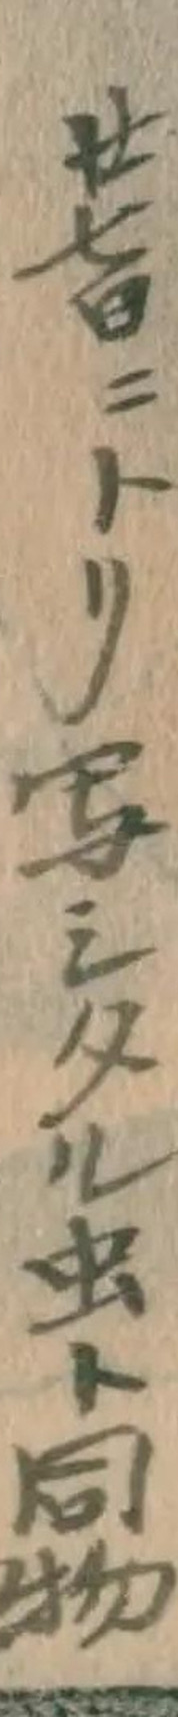廿七日ニトリ写シタル虫ト同物
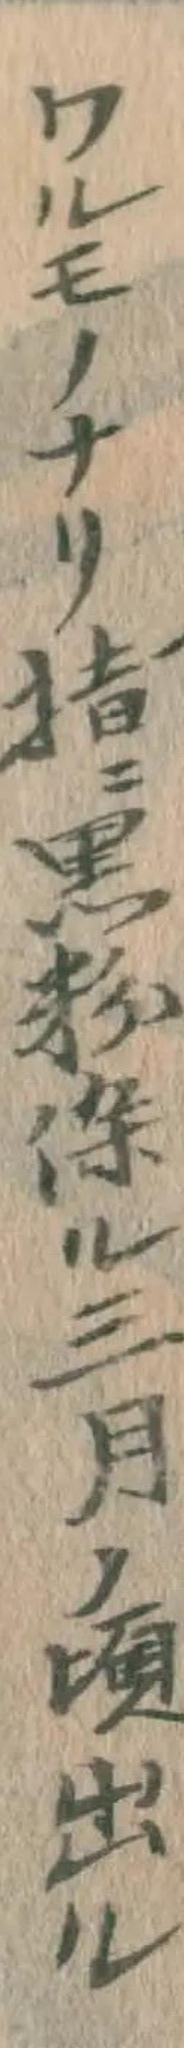ワルモノナリ指ニ黒彩染ル三月ノ頃出ル
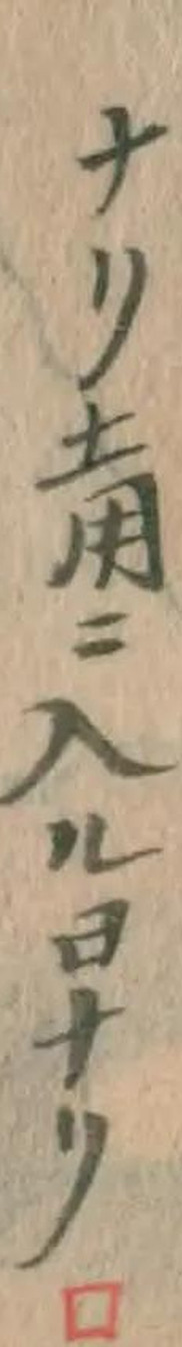ナリ土用ニ入ル日ナリ▢
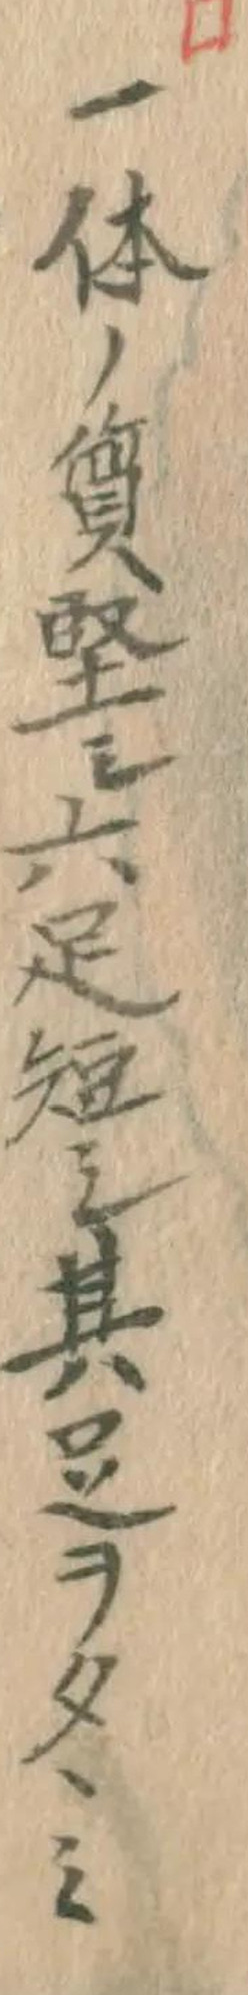▢一体ノ質堅シ六足短シ其足ヲタヽミ
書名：千蟲譜 3巻. [1]
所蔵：国立国会図書館 National Diet Library, JAPAN
